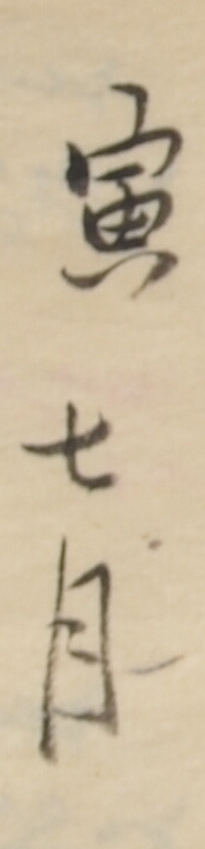寅七月
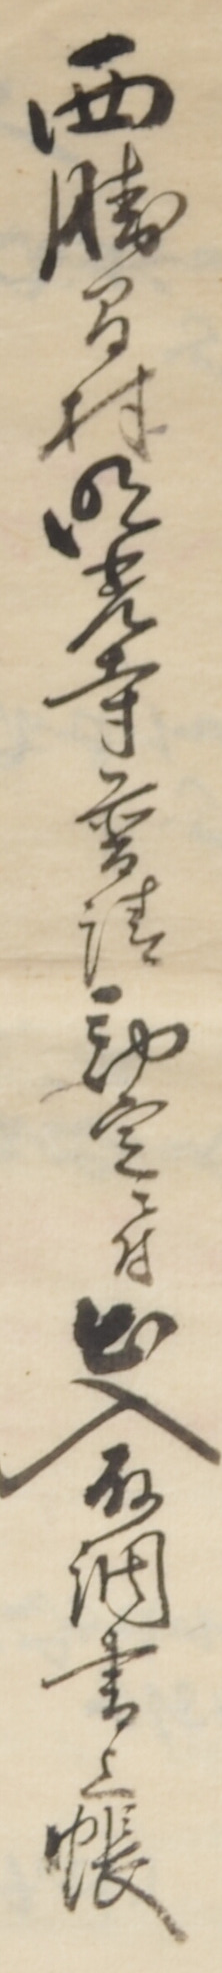西勝間村明光寺普請勘定ニ付出入取調書上帳
